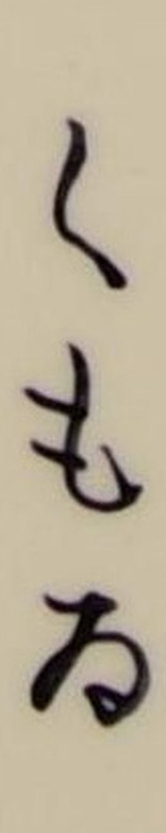くもゐ
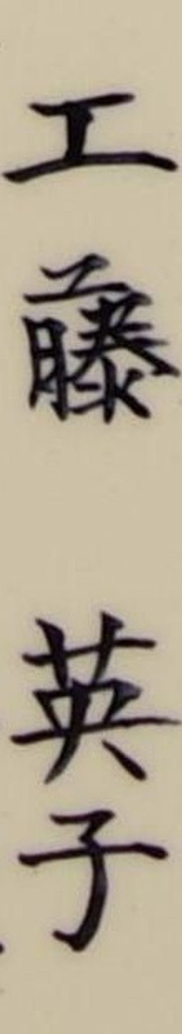工藤英子
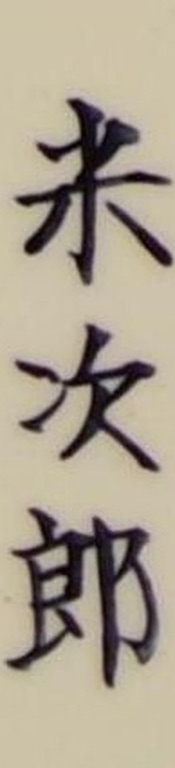米次郎
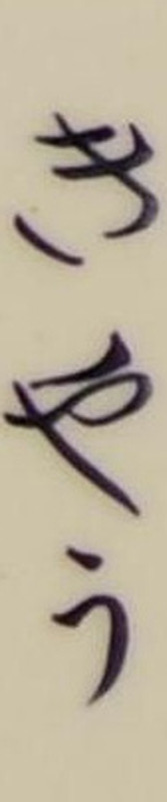きやう
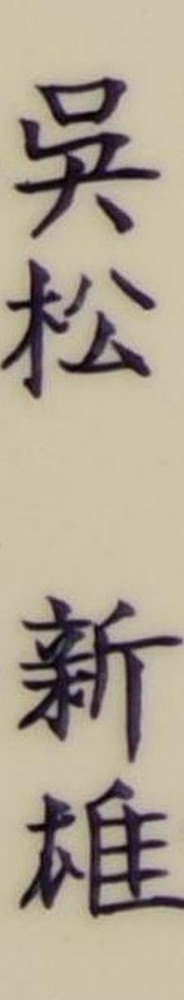呉松新雄
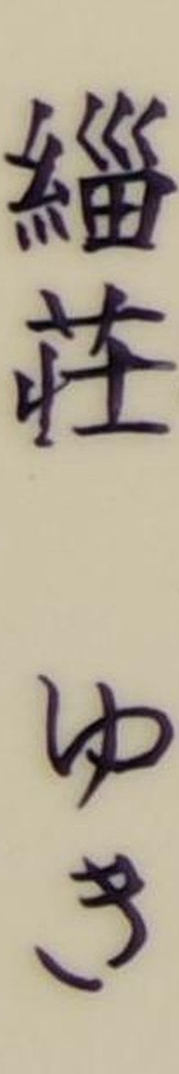緇荘ゆき
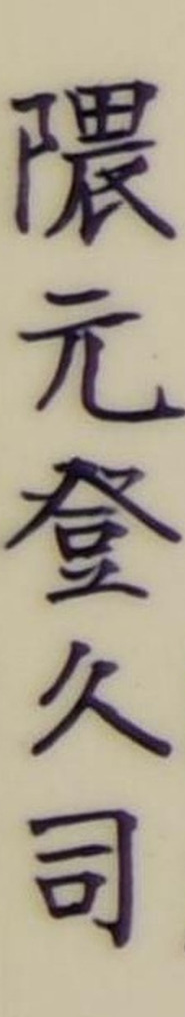隈元登久司

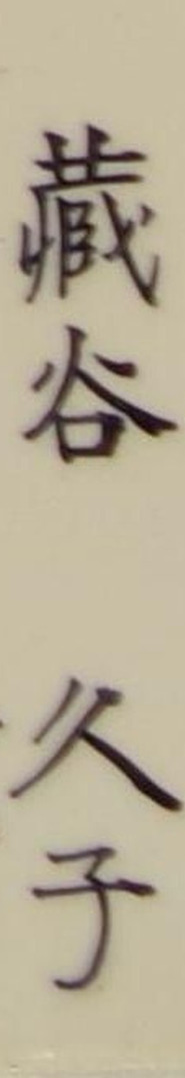蔵谷久子
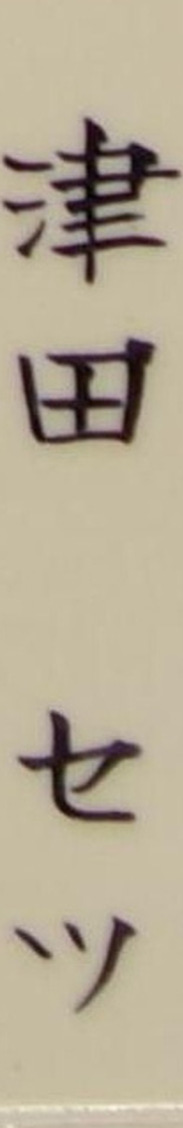津田セツ
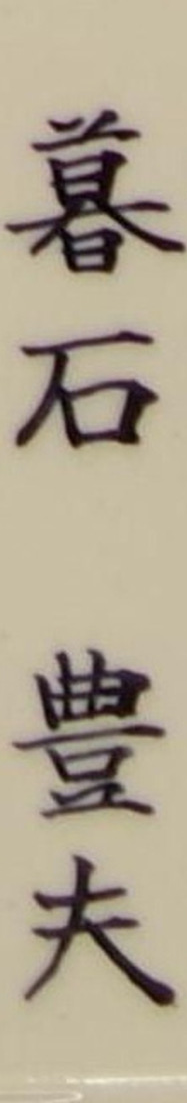暮石豊太
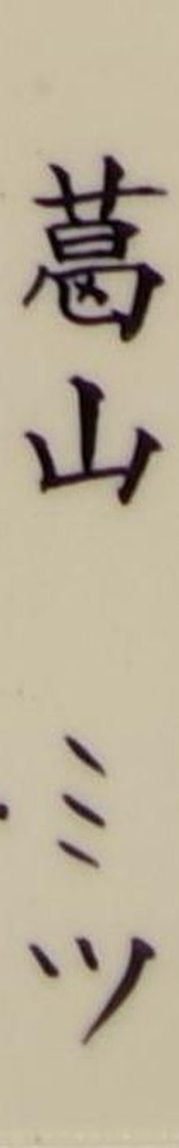葛山ミツ
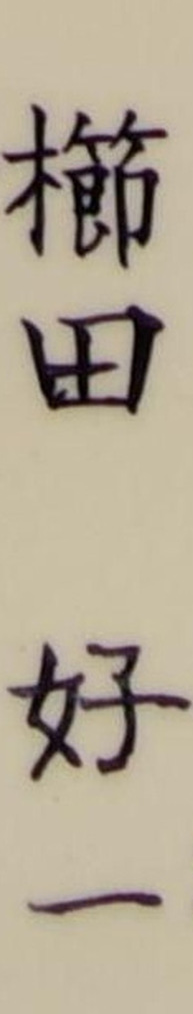櫛田好一
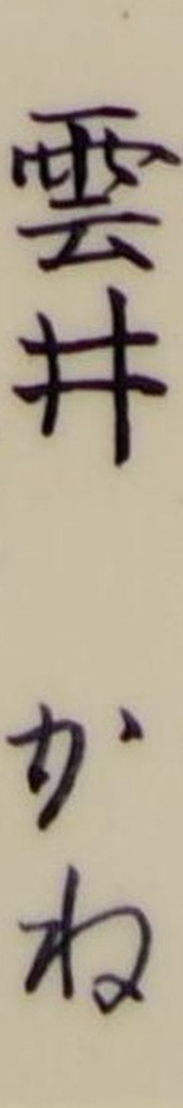雲井かね
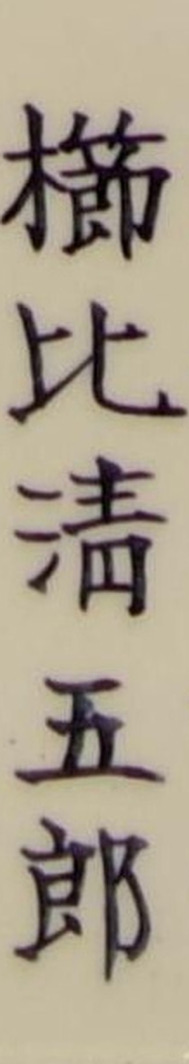櫛比清五郎
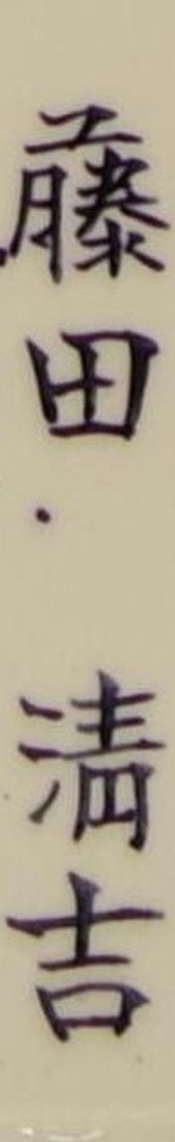藤田清吉
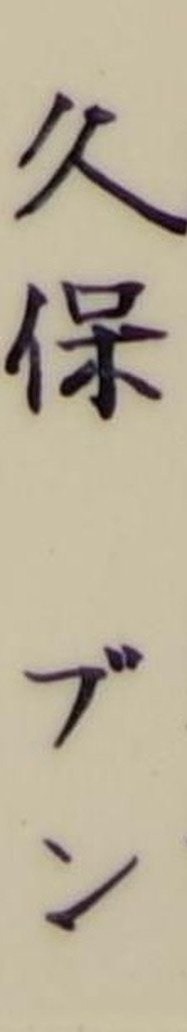久保ブン
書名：A~D
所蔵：koyasan kongobuji
